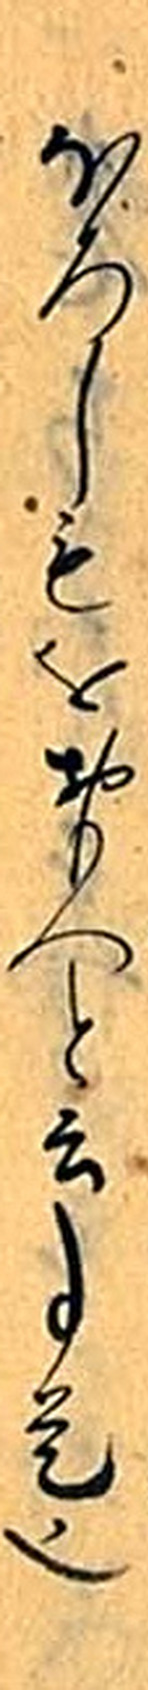ほろしもをおもへと云事是也
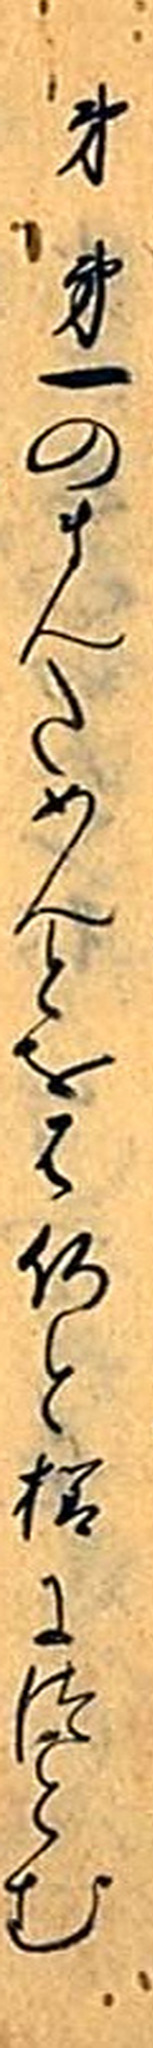弟第一のまんためんとをは何と様につとむ
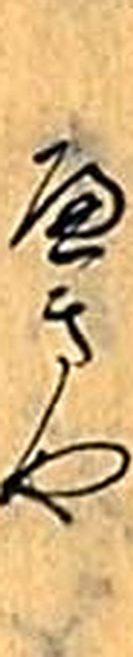へきや
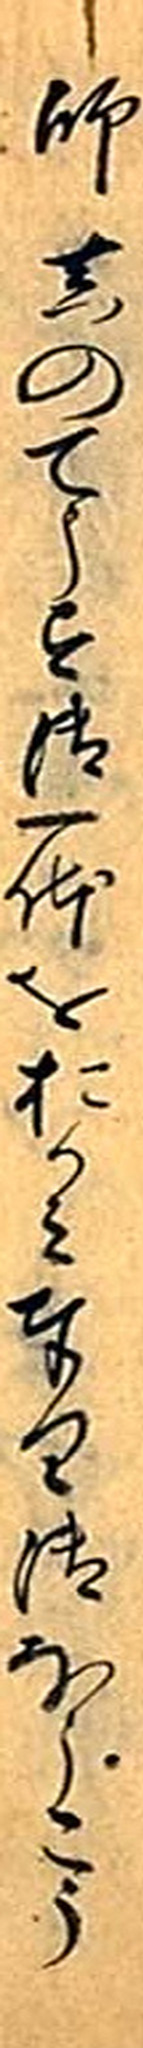師真のてうす御一体をおかみ奉り御ほうこう
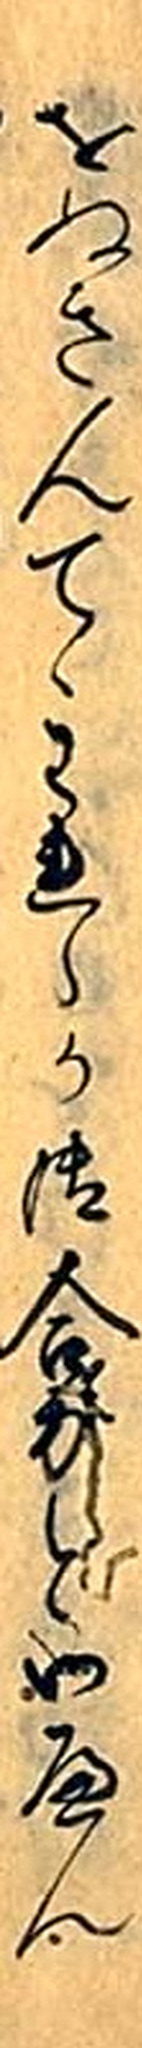をぬきんてゝわれらか御合力と御へん
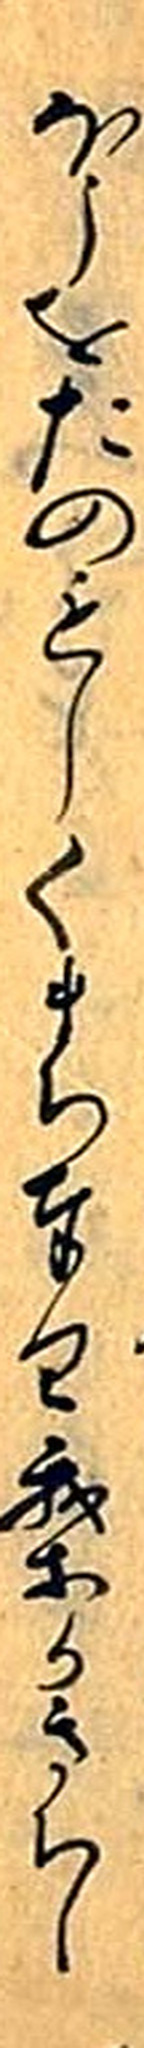ほうをたのもしくまち奉り我等かきちし
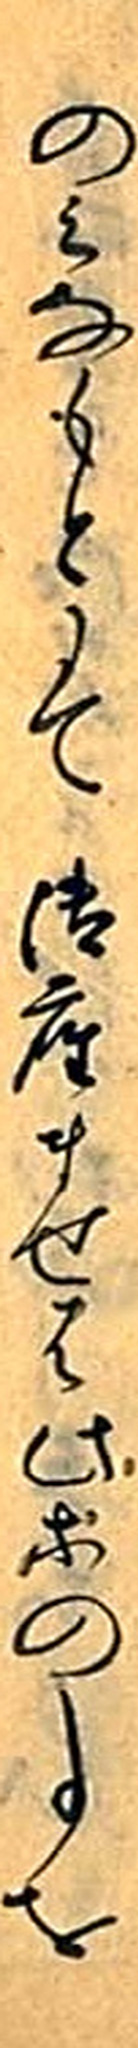のみなもとにて御座ませは此等の事を
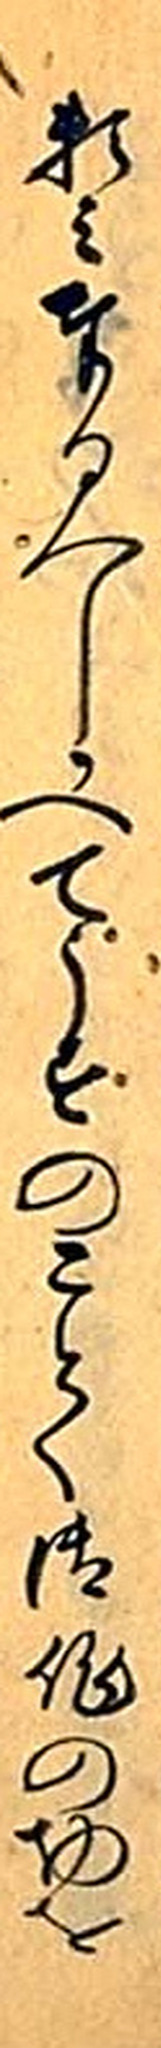頼み奉るへし又てうすのことく御作の物を
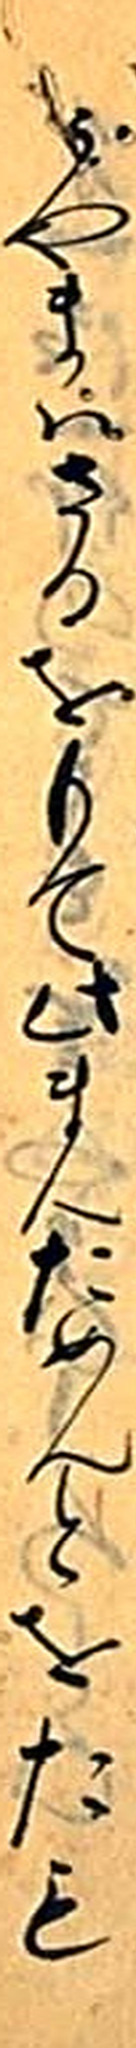うやまはさるをもて此まんためんとをたも
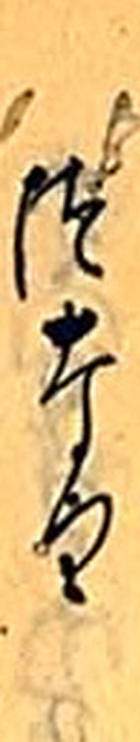つなり
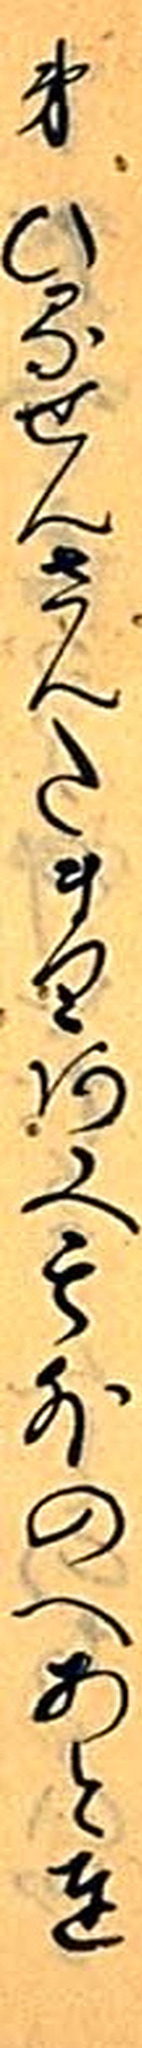弟ひるせんさんたまりあ又其外のへあと達
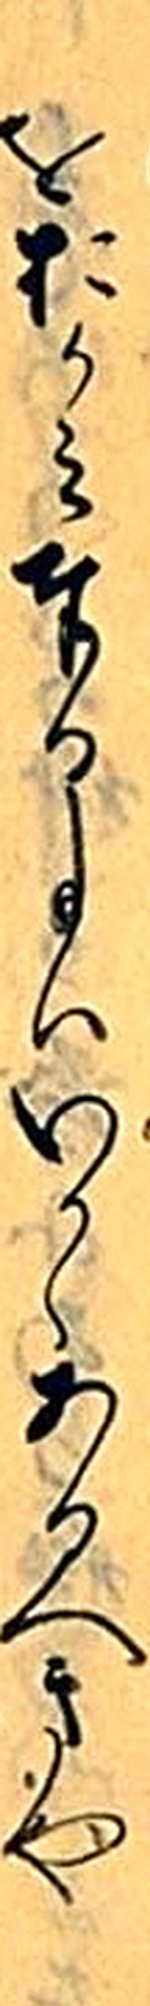をおかみ奉る事はいかゝあるへきや
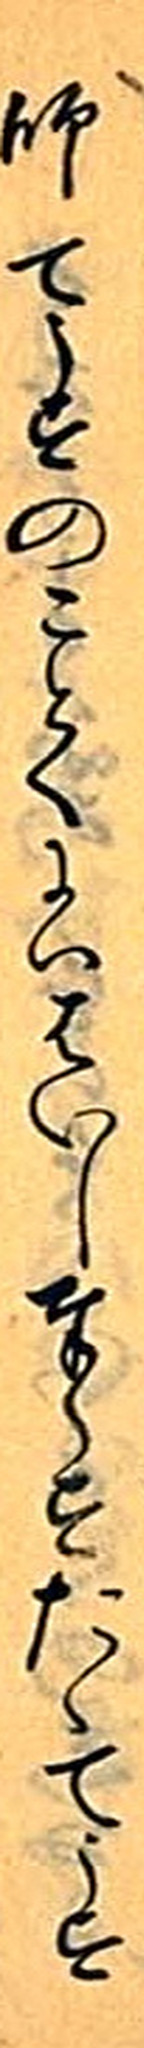師てうすのことくにははいし奉らすたゝてうす
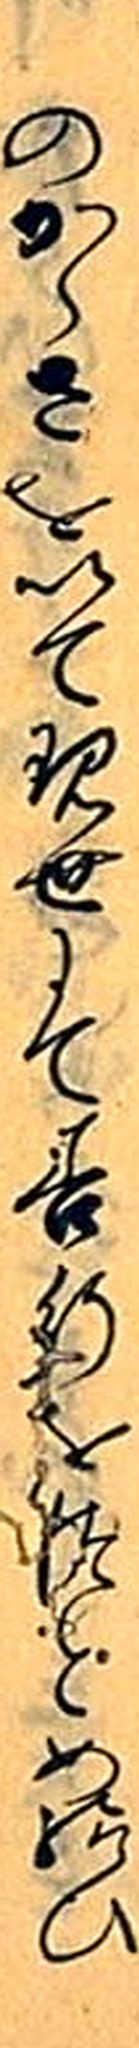のからさを以て現世にて善行をつとめ給ひ
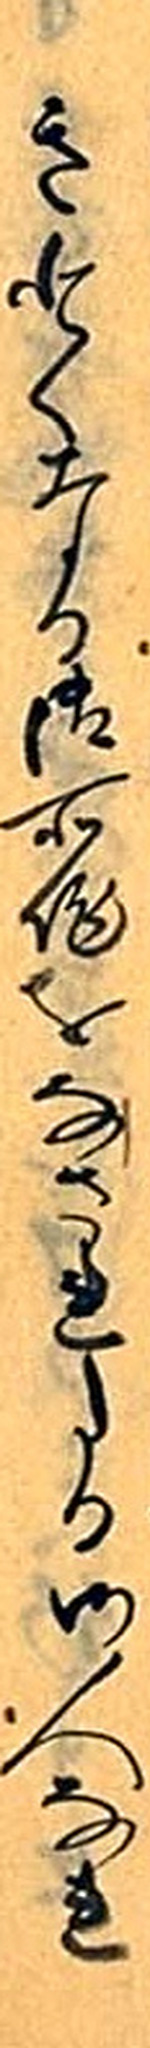きとくなる御所作をなされたる御人なれ
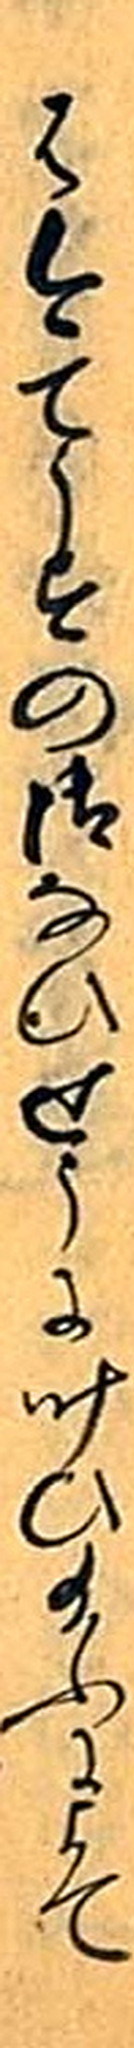は今てうすの御なひせうに叶ひ給ふによて
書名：ドチリナ・キリシタン
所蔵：東京大学総合図書館 / General Library in the University of Tokyo
